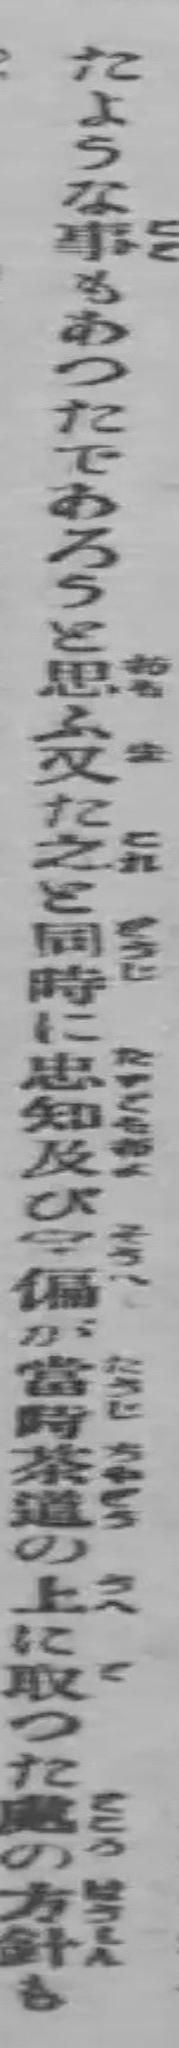たような事もあつたであろうと思ふ又た之と同時に忠知及び宗偏が当時茶道の上に取つた処の方針も
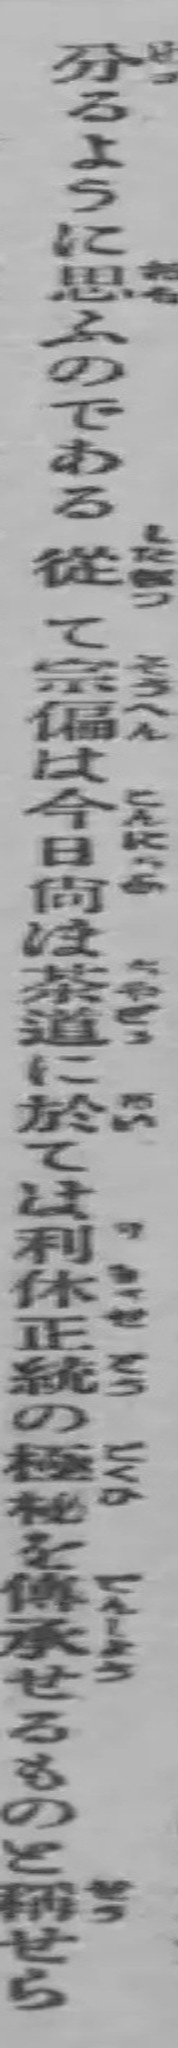分るように思ふのである従て宗偏は今日尚ほ茶道に於いては利休正統の極秘を伝承せるものと称せら
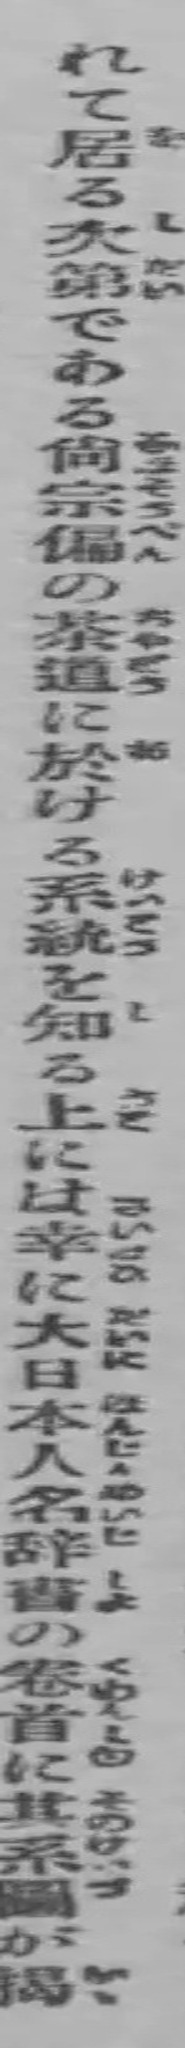れて居る次第である尚宗偏の茶道に於ける系統を知る上には幸に大日本人名辞書の巻首に其系図が掲
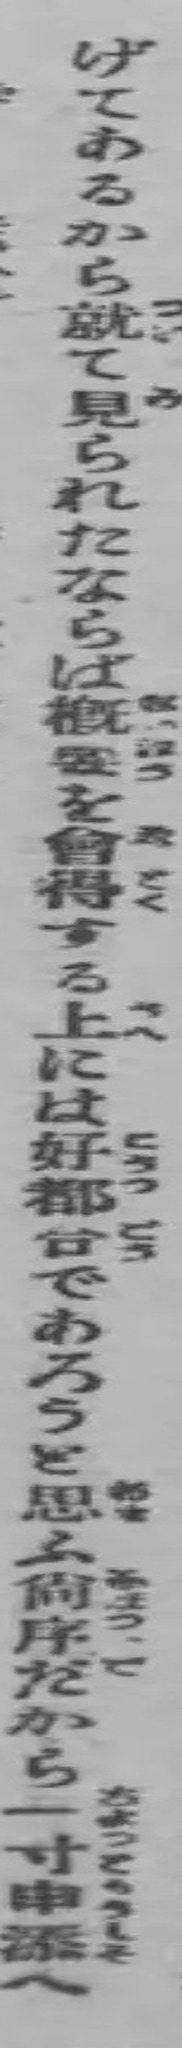げてあるから就て見られたならば概要を会得する上には好都合であろうと思ふ尚序だから一寸申添へ
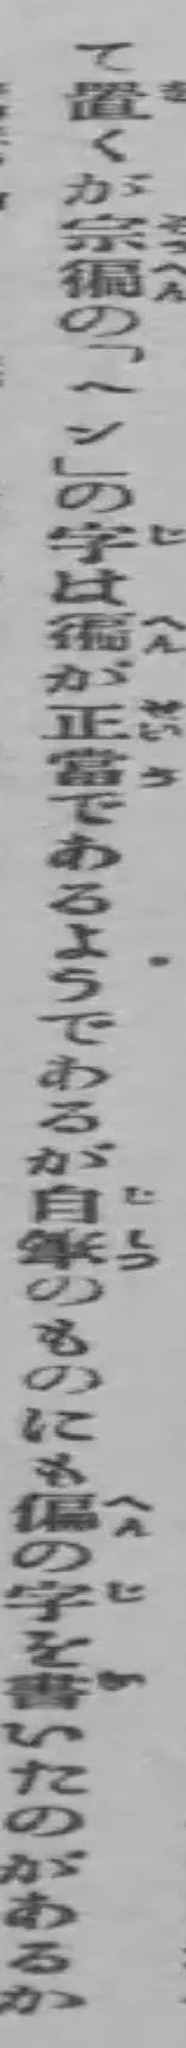て置くが宗徧の「ヘン」の字は徧が正当であるようであるが自筆のものにも偏の字を書いたのがあるか
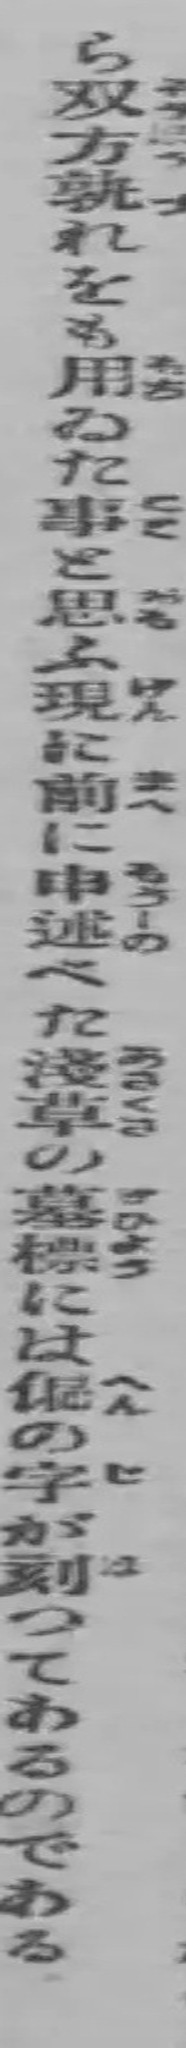ら双方孰れをも用ゐた事と思ふ現に前に申述べた浅草の墓標には偏の字が刻つてあるのである
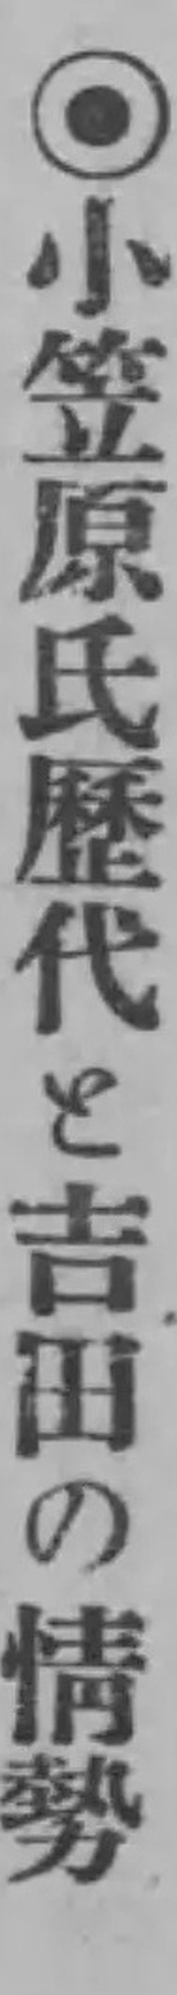⦿小笠原氏歴代と吉田の情勢
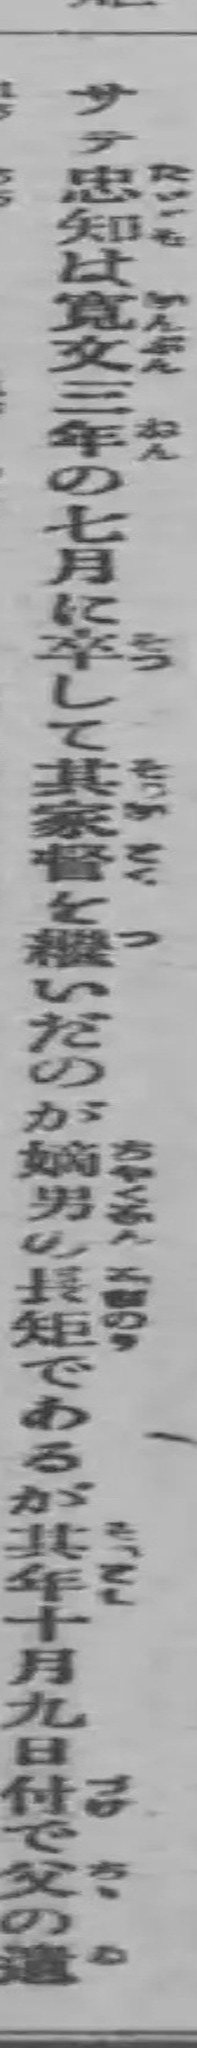小笠原長矩サテ忠知は寛文三年の七月に卒して其家督を継いだのが嫡男の長矩であるが其年十月九日付で父の遺

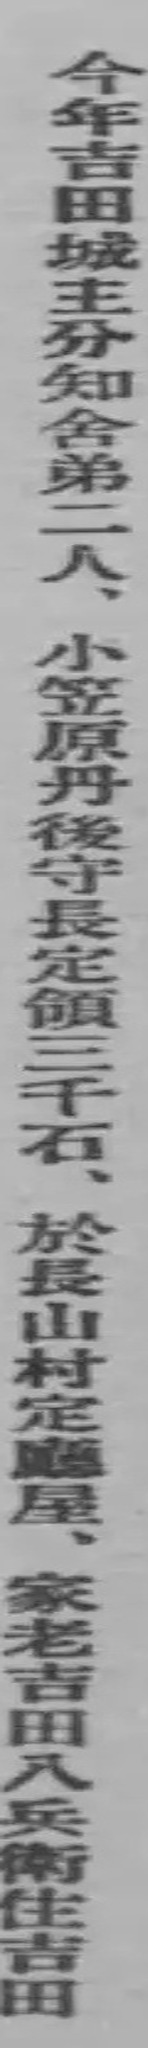今年吉田城主分知舎弟二人、小笠原丹後守長定領三千石、於長山村庁屋、家老吉田八兵衛住吉田
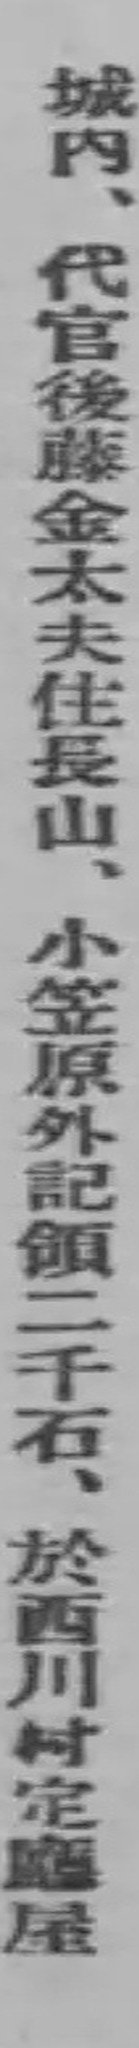城内、代官後藤金太夫住長山、小笠原外記領二千石、於西川村定庁屋
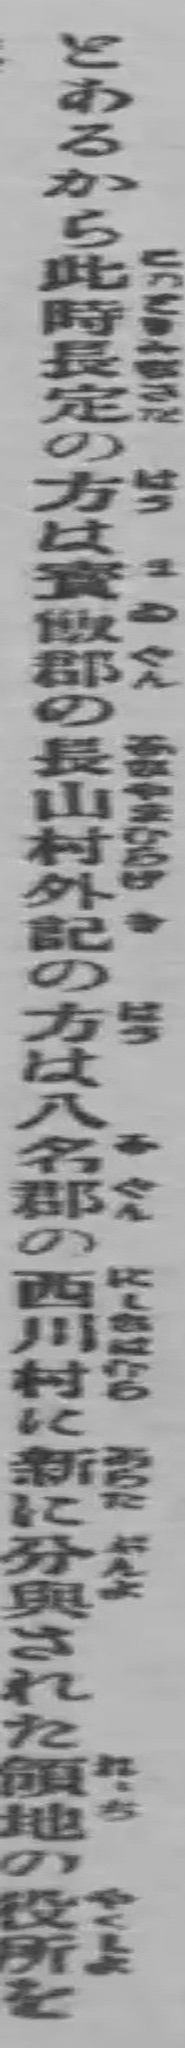とあるから此時長定の方は宝飯郡の長山村外記の方は八名郡の西川村に新に分与された領地の役所を
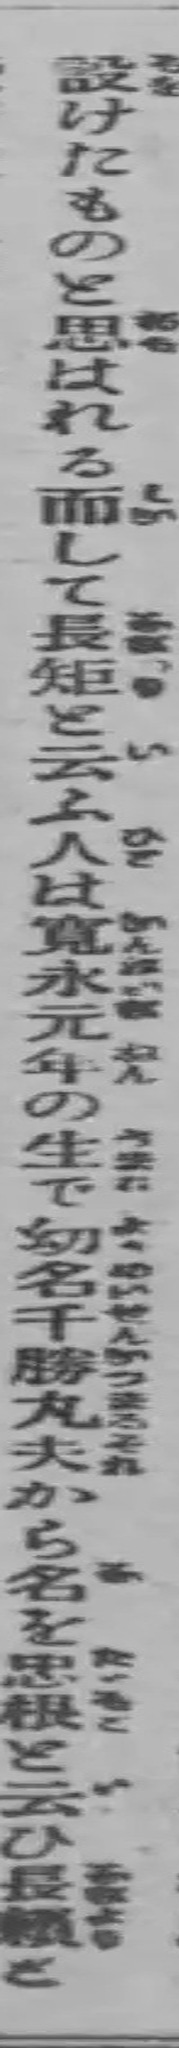設けたものと思はれる而して長矩と云ふ人は寛永元年の生で幼名千勝丸夫から名を忠根と云ひ長頼と
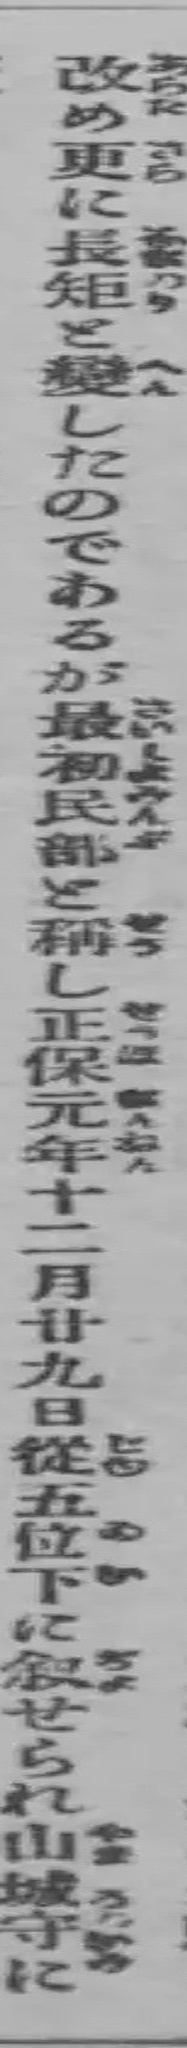改め更に長矩と変したのであるが最初民部と称し正保元年十二月廿九日従五位下に叙せられ山城守に
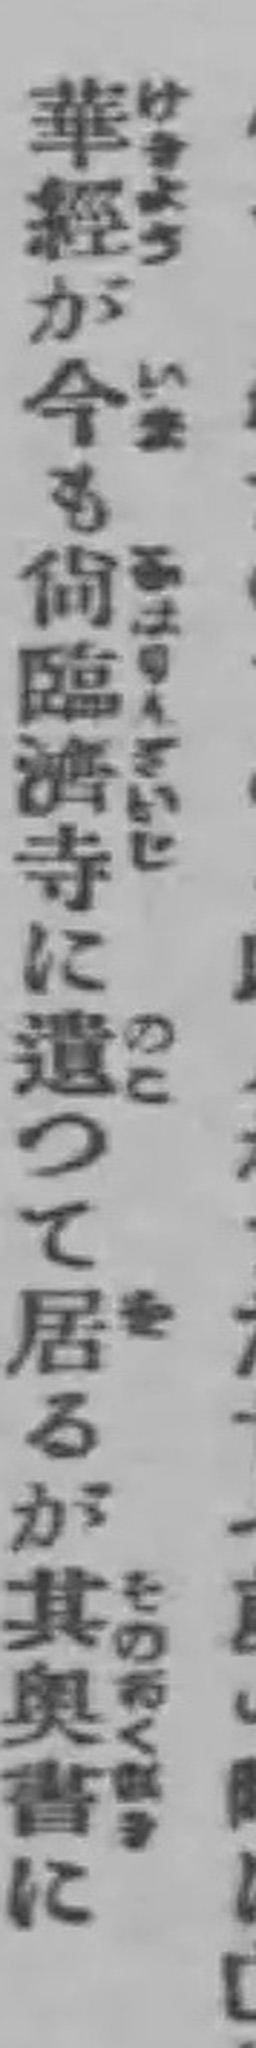華経が今も尚臨済寺に遺つて居るが其奥書に
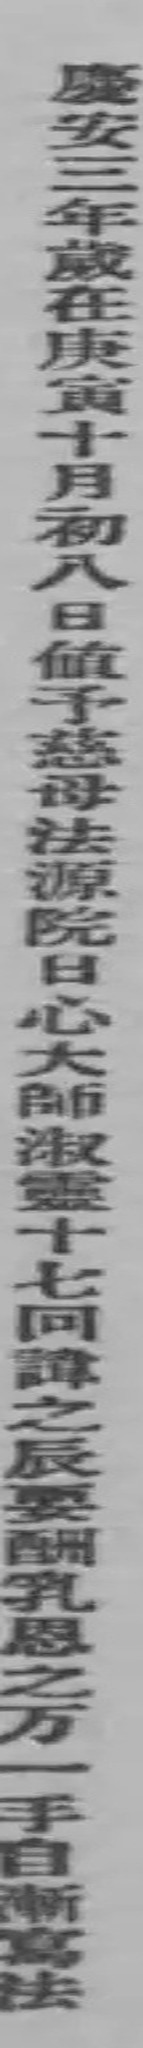慶安三年歳在庚寅十月初八日値予慈母法源院日心大師淑霊十七回諱之辰要酬乳恩之万一手自漸写法
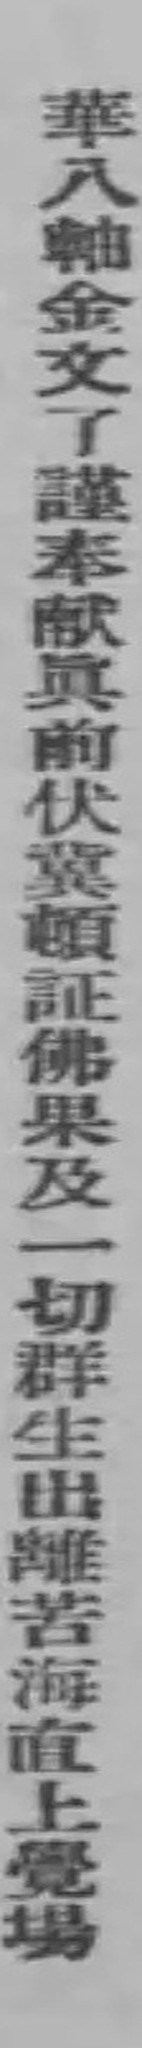華八軸金文了謹奉献真前伏冀頓証仏果及一切群生出離苦海直上覚場
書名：豊橋市史談
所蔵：国立国会図書館 National Diet Library, JAPAN
